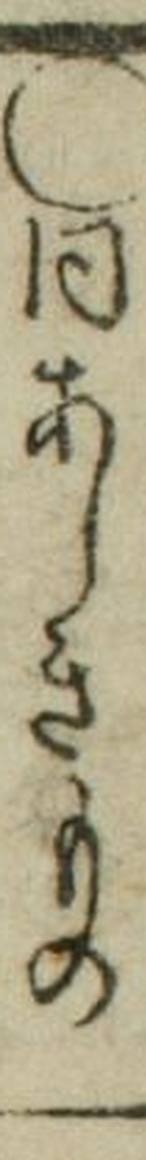○同あしきもの
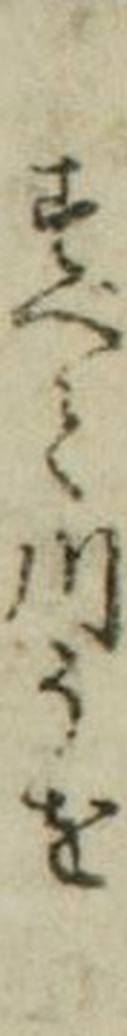すべて川うを
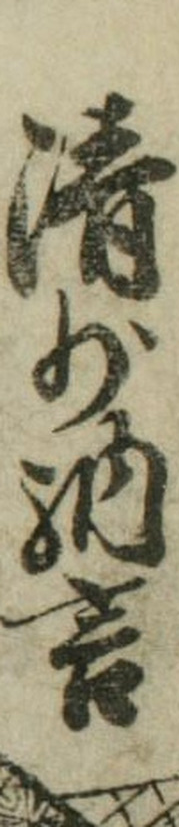清少納言
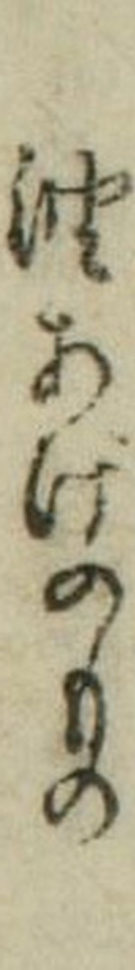油あげのもの
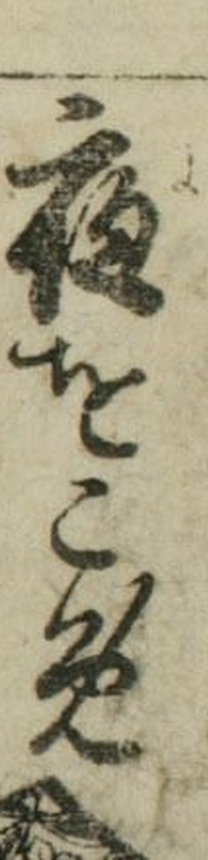夜をこめ
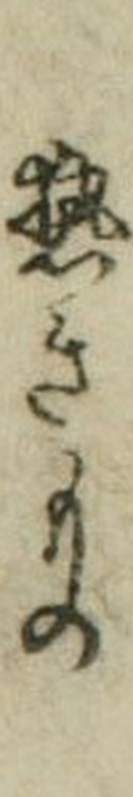熱きもの
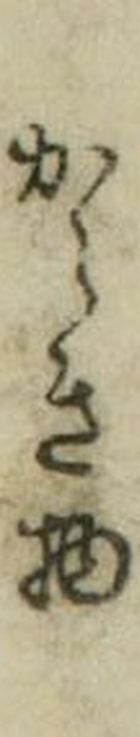からき物
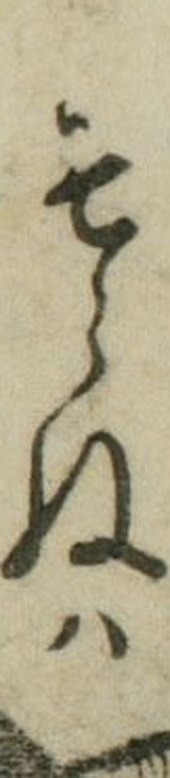そらねは
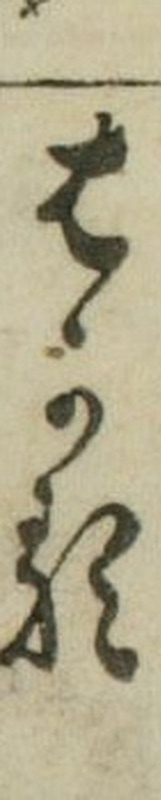はかる
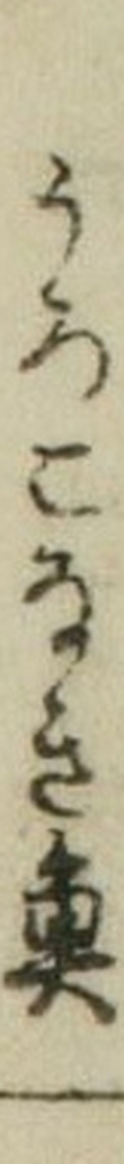うろこなき魚
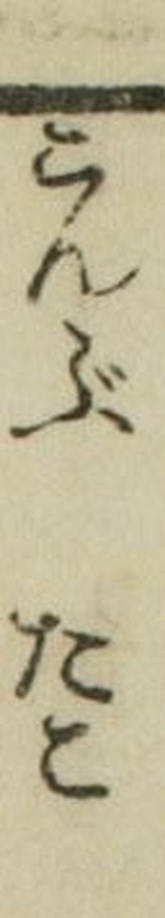こんぶたこ
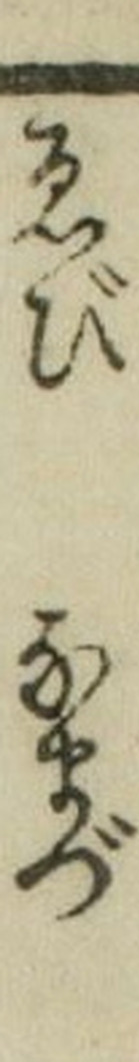ゑびなまづ
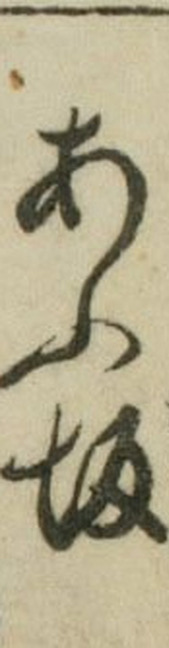あふ坂
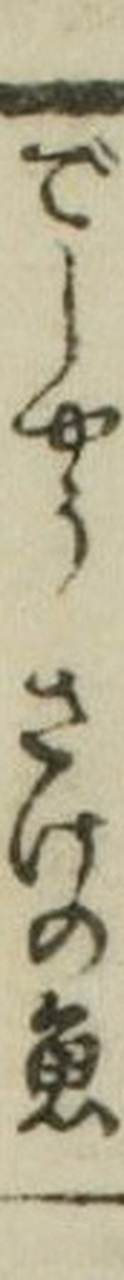でしやうさけの魚
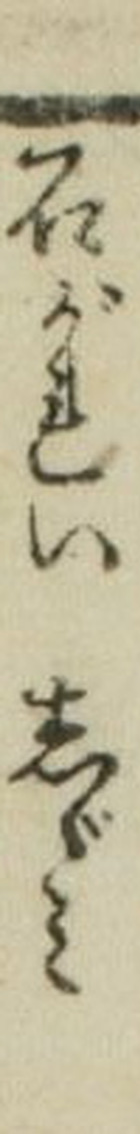石がれいしゞみ
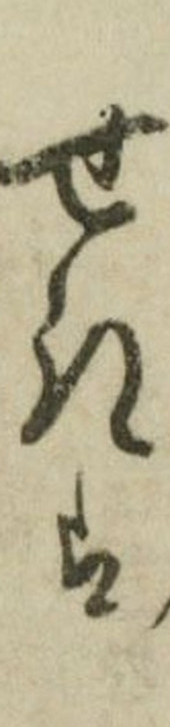せきは
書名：百人一首
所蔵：東京学芸大学教育コンテンツアーカイブ
